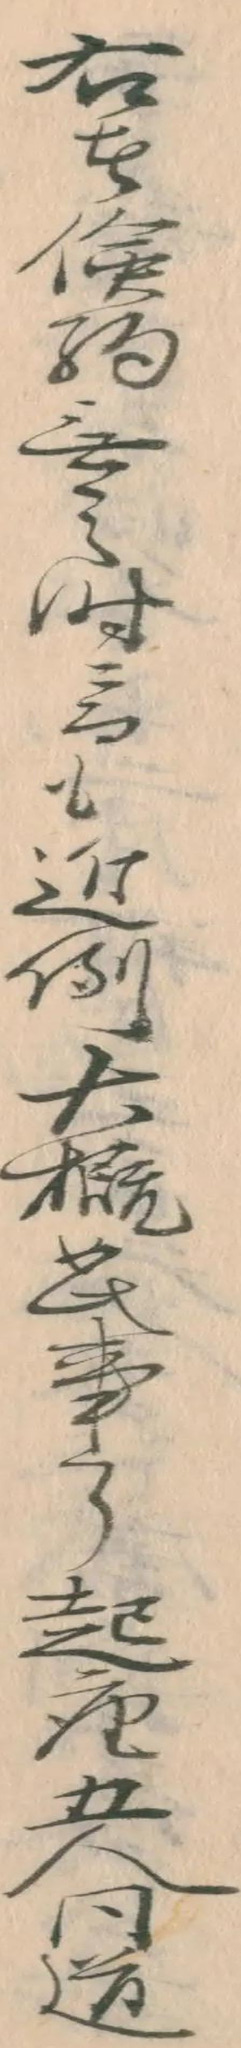右は倹約無之時ニ而も近例大概如此事了起座五人同道
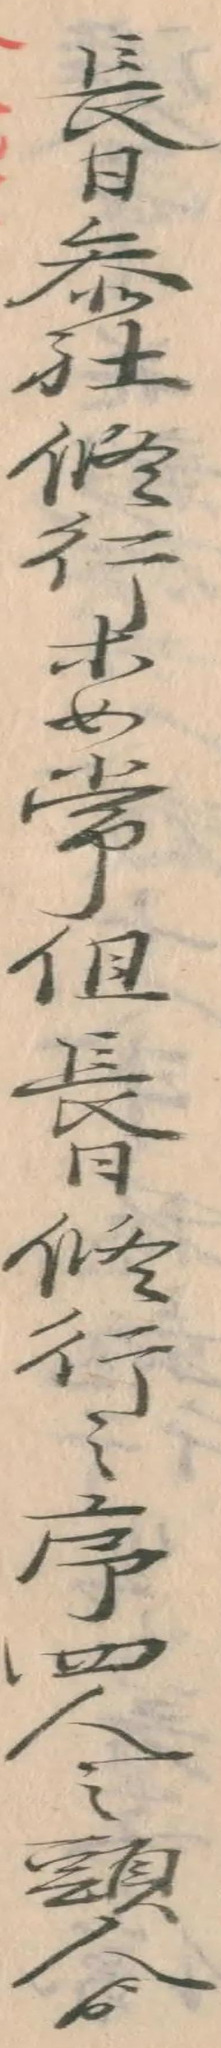長日参社修行等如常但長日修行之序四人之頭人ゟ
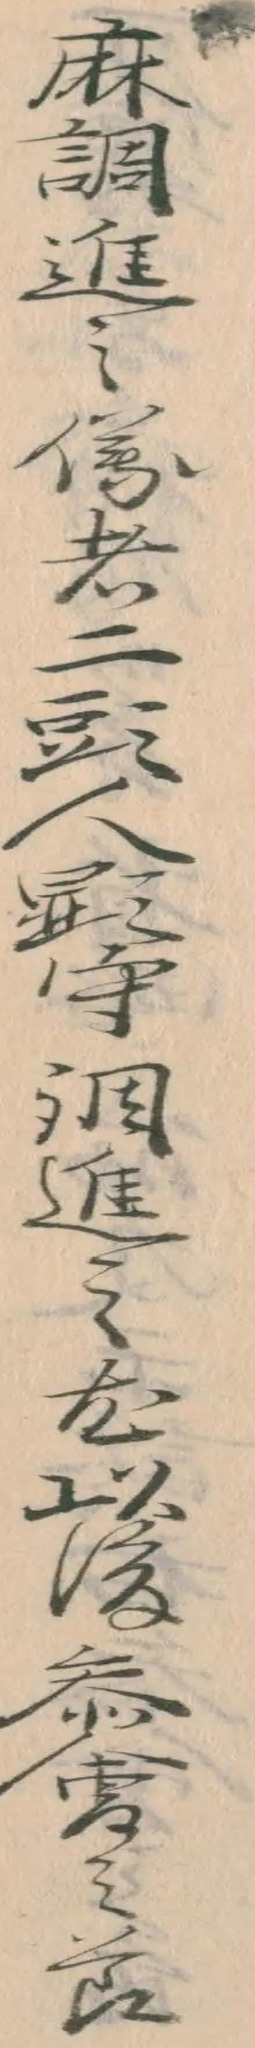麻調進之儀者二頭人顕守調進之尤以後参會之節
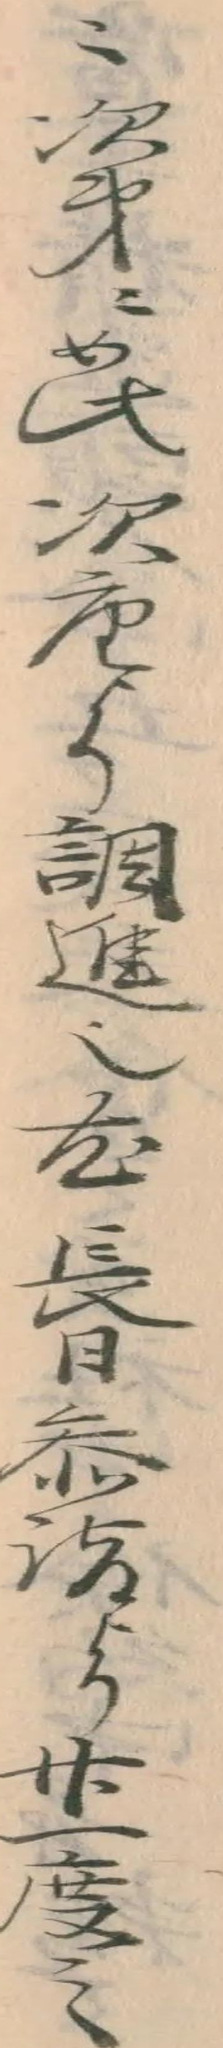々次第ニ如此次座より調進也尤長日参詣より廿一度之
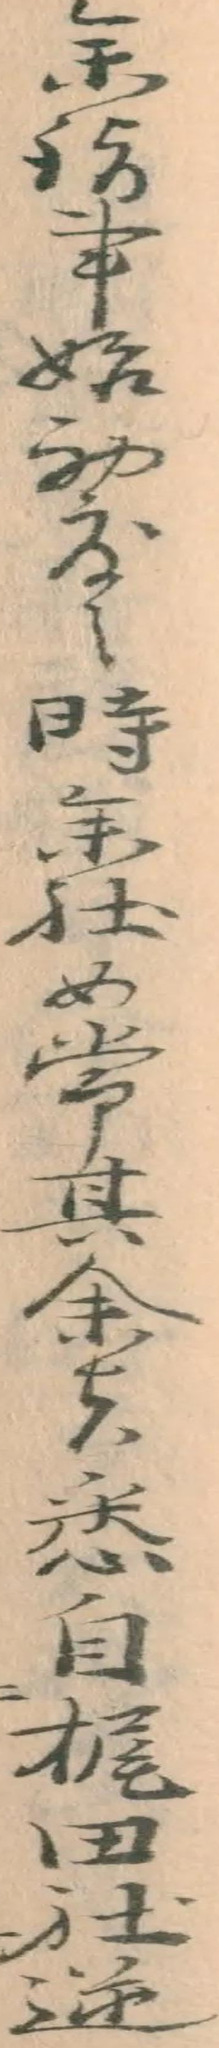参詣事始初度之時参社如常其余は悉自梶田社逆
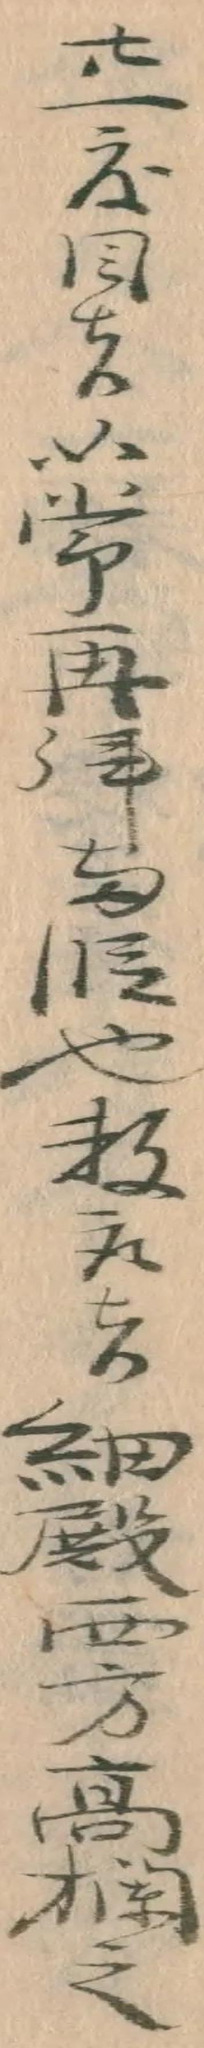廿一度目は如常再拝両段也数取旨細殿西方高欄之
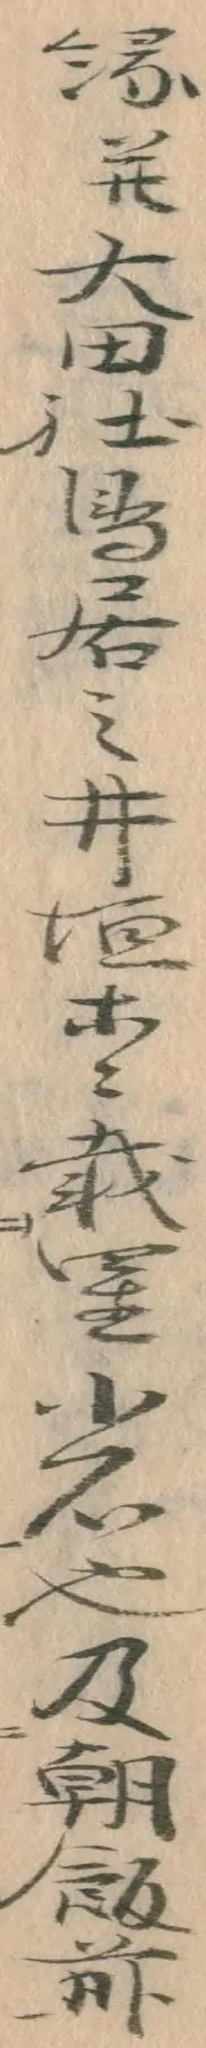縁并大田社鳥居之井垣等々載置小石也及朝飯前
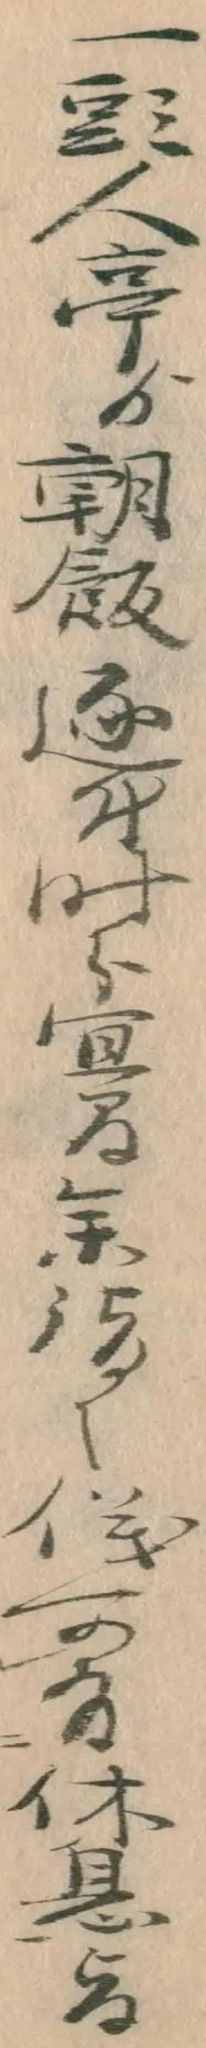一頭人亭ゟ朝飯逐付時分宜間参詣之儀可有休息旨
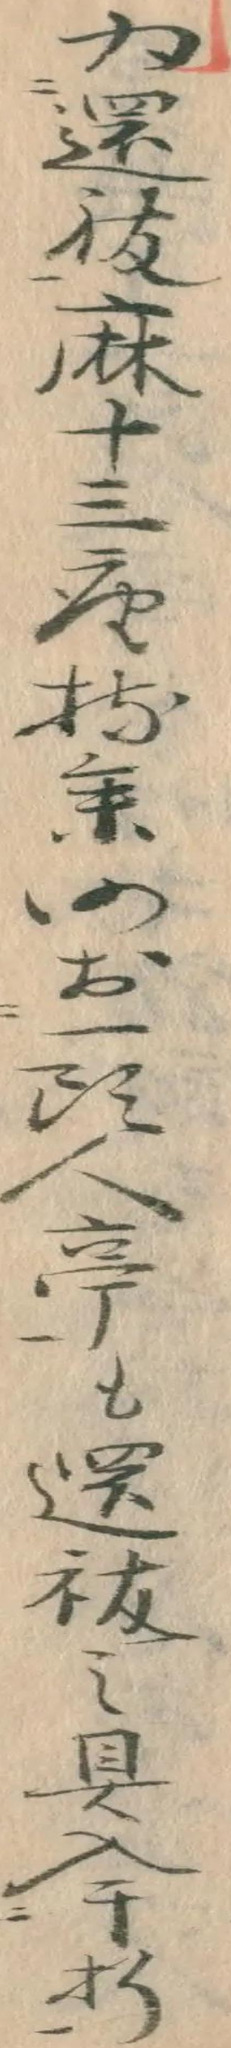為還抜麻十三座持参仍於一頭人亭も還祓之具入于折
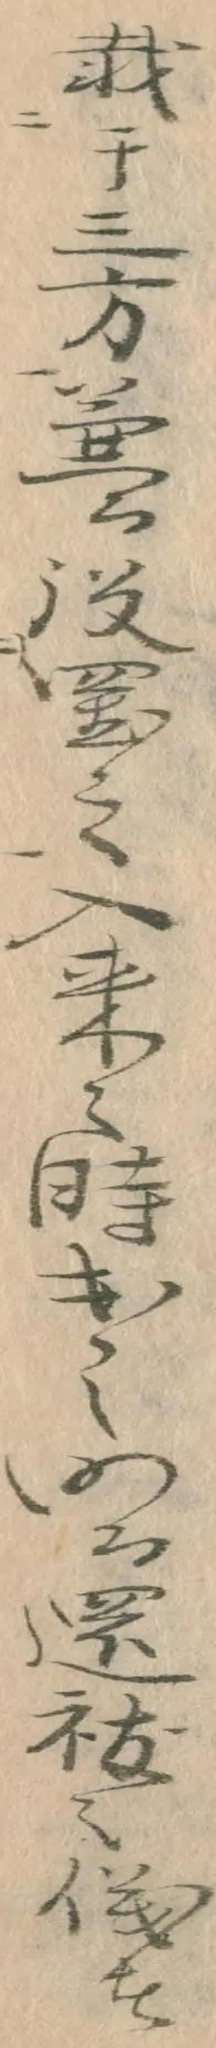載于三方兼而役置之入来之時出也仍而還祓之儀は
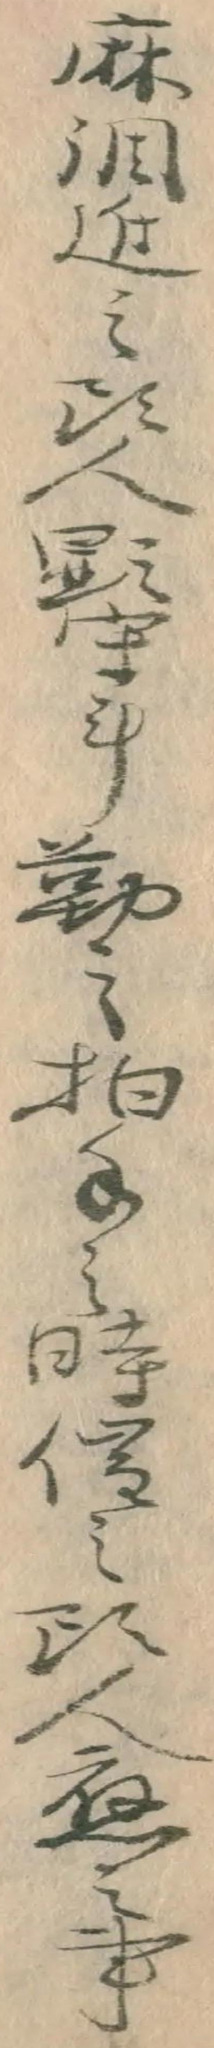麻調進之頭人顕守斗勤之相手之時催之頭人應応之事

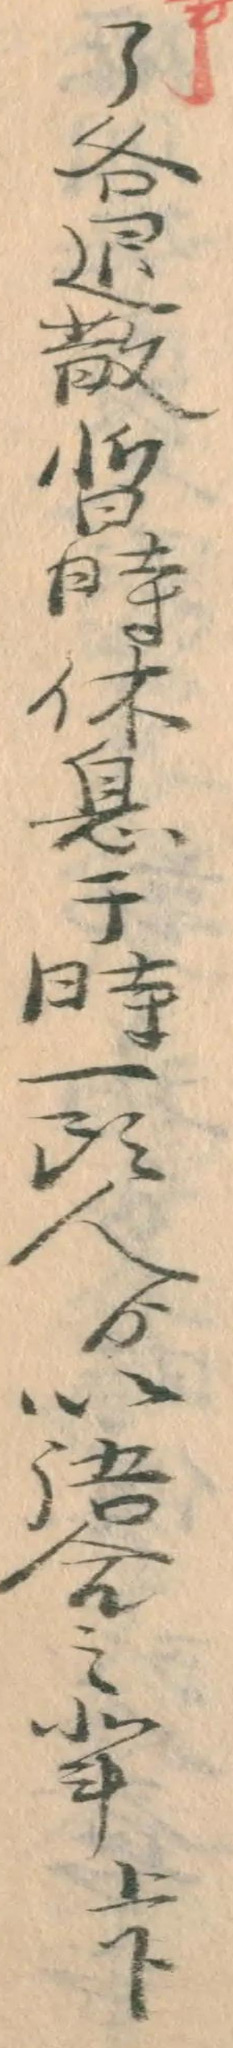了各退散暫時休息于時一頭人ゟ以語合之輩上下
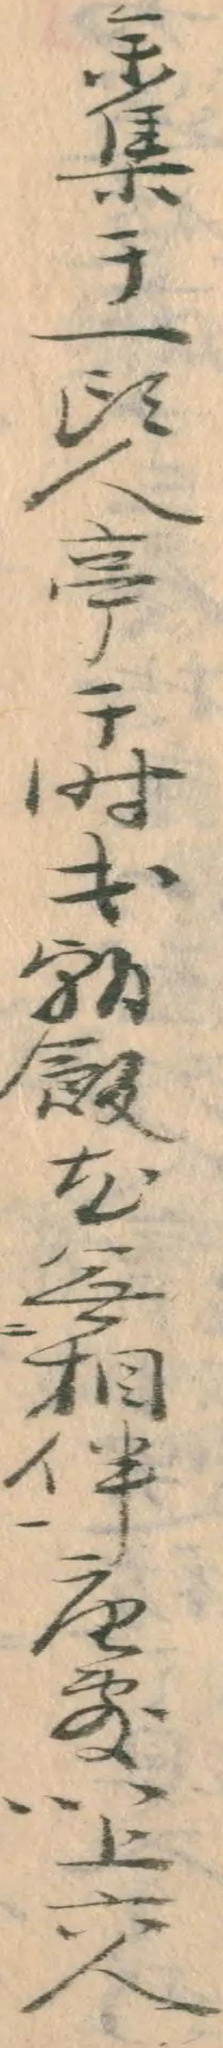参集于一頭人亭于時本朝殿尤無相伴座敷以上六人
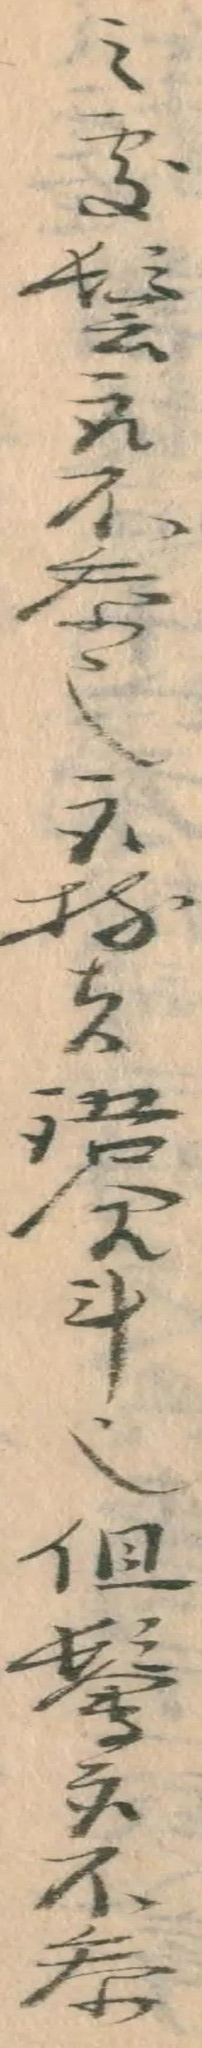之ところ髻取不参也取持は語合斗也但髻取不参
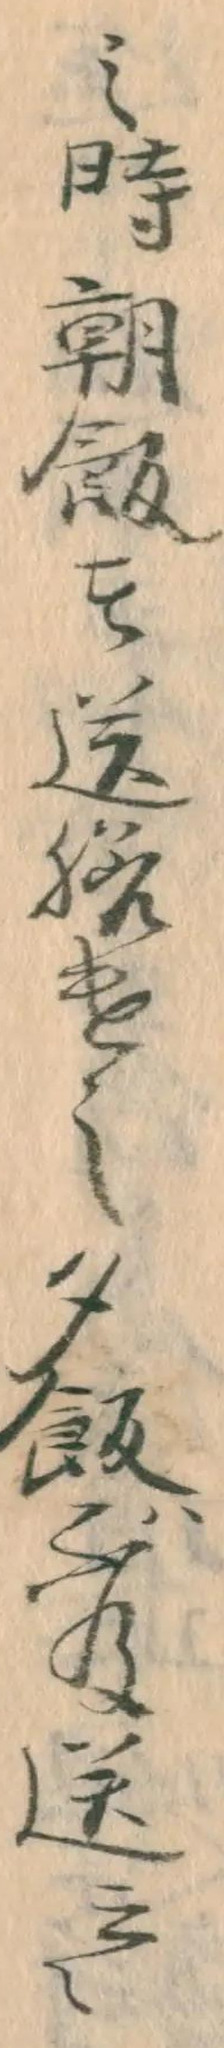之時朝飯者送膳遣之夕飯不及送云々
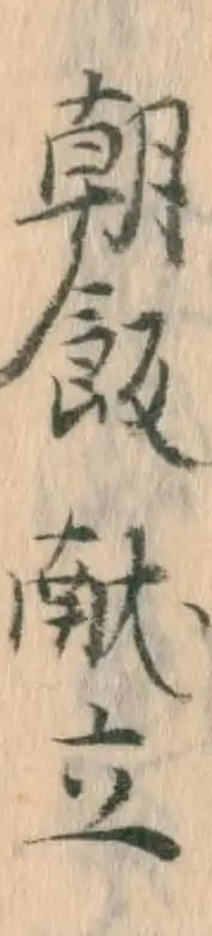朝飯献立
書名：賀茂社記録. 第72冊
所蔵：国立国会図書館 National Diet Library, JAPAN
